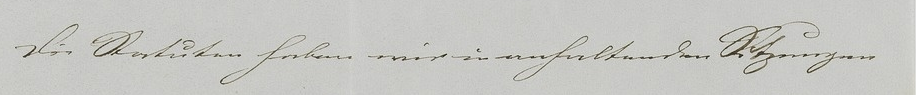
Die Statuten haben wir in anhaltenden Sitzungen
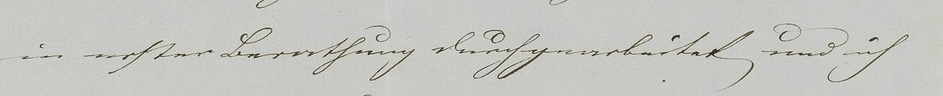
in erster Berathung durchgearbeitet, und ich
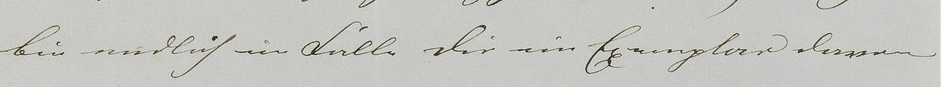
bin endlich im Falle Dir ein Exemplar davon
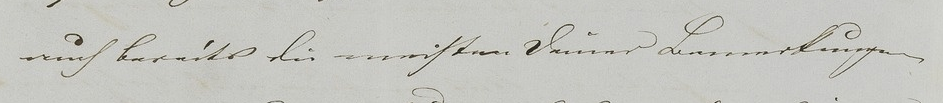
auch bereits die meisten Deiner Bemerkungen
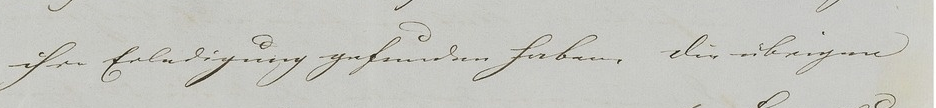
ihre Erledigung gefunden haben. Die übrigen
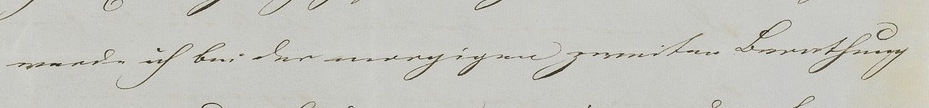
werde ich bei der morgigen zweiten Berathung
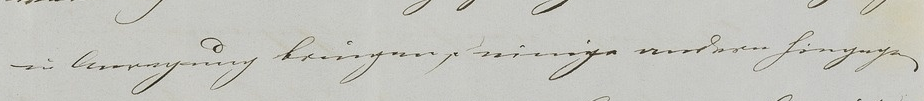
in Anregung bringen; einige andere hingegen
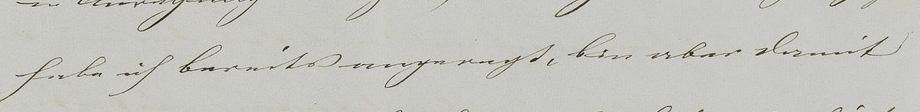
habe ich bereits angeregt, bin aber damit
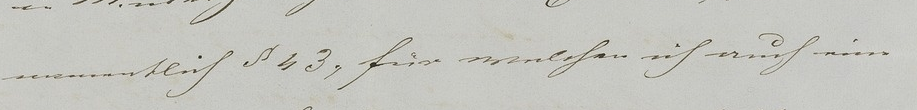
namentlich § 43, für welchen ich auch eine
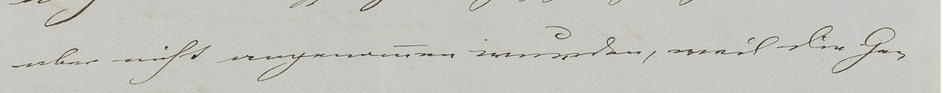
aber nicht angenommen wurden, weil die Ge-
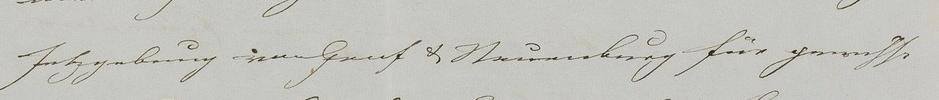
setzgebung von Genf & Neuenburg für gewisse
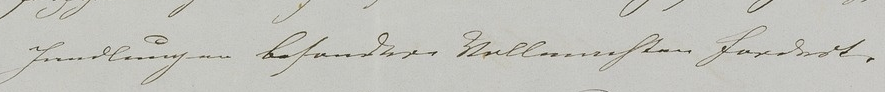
Handlungen besondere Vollmachten fordert.
